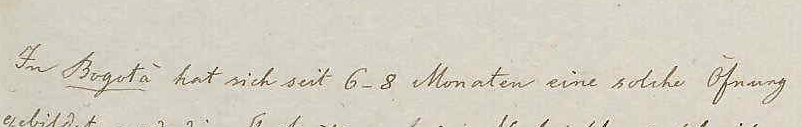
In Bogotà hat sich seit 6–8 Monaten eine solche Öfnung
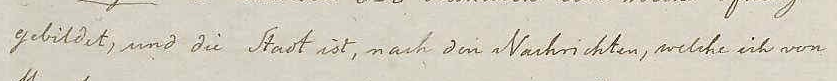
gebildet, und die Stadt ist, nach den Nachrichten, welche ich von
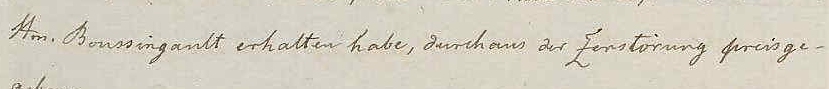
Hrn. Boussingault erhalten habe, durchaus der Zerstörung preisge-
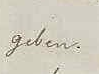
geben.
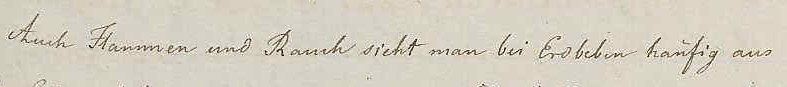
Auch Flammen und Rauch sieht man bei Erdbeben häufig aus
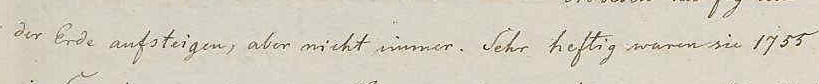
der Erde aufsteigen, aber nicht immer. Sehr heftig waren sie 1755
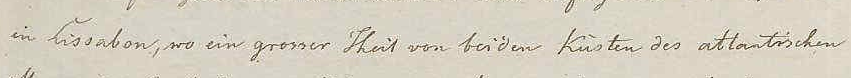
in Lissabon, wo ein grosser Theil von beiden Küsten des atlantischen
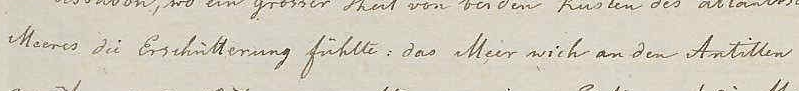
Meeres die Erschütterung fühlte: das Meer wich an den Antillen
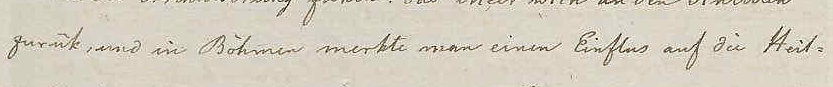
zurük, und in Böhmen merkte man einen Einflus auf die Heil-
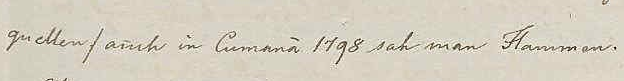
quellen auch in Cumanà 1789 sah man Flammen.
